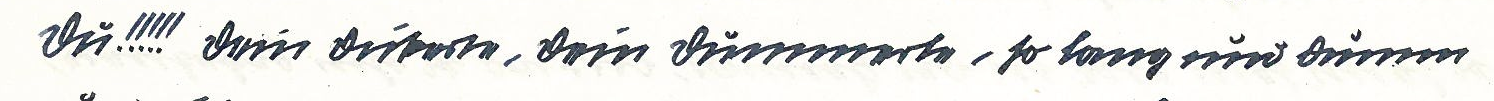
Du!!!!! Dein Dickerle, Dein Dummerle, so lang und dumm
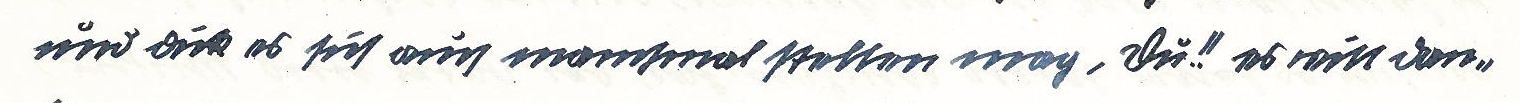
und dick es sich auch manchmal stellen mag, Du!! es will dan¬
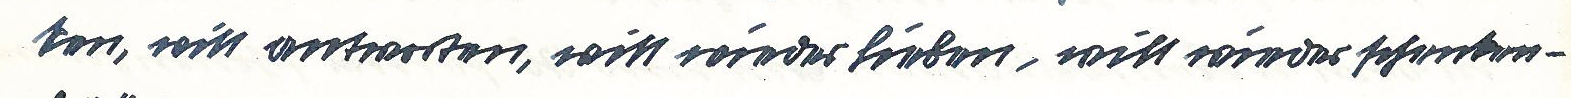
ken, will antworten, will wieder lieben, will wieder schenken –
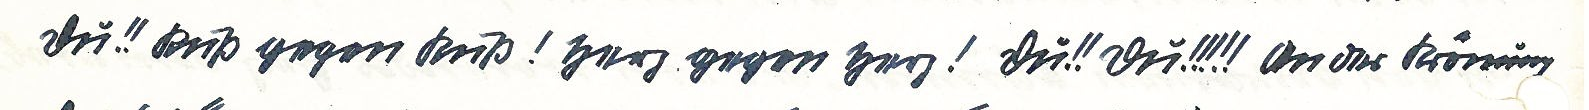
Du!! Kuß gegen Kuß! Herz gegen Herz! Du!! Du!!!!! An der Krönung
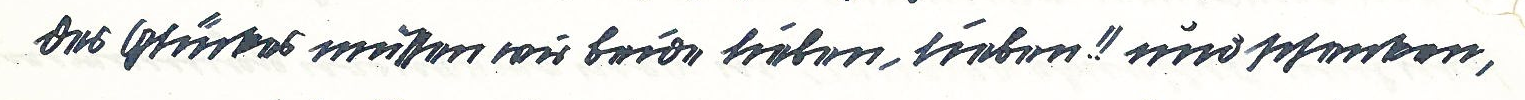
des Glückes müssen wir beide lieben, lieben!! und schenken,
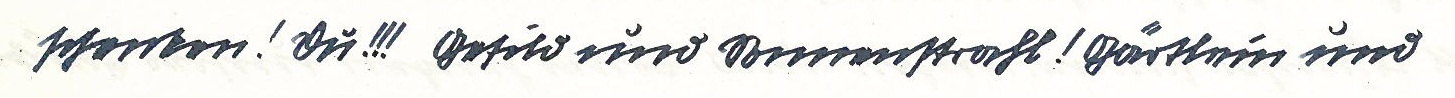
schenken! Du!!! Gefild und Sonnenstrahl! Gärtlein und
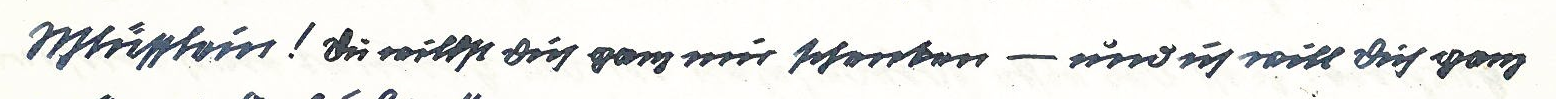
Schlüsslein! Du willst Dich ganz mir schenken – und ich will Dich ganz
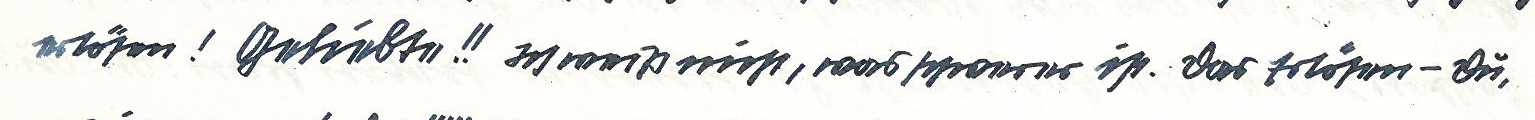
erlösen! Geliebte!! Ich weiß nicht, was schwerer ist. Das Erlösen – Du,
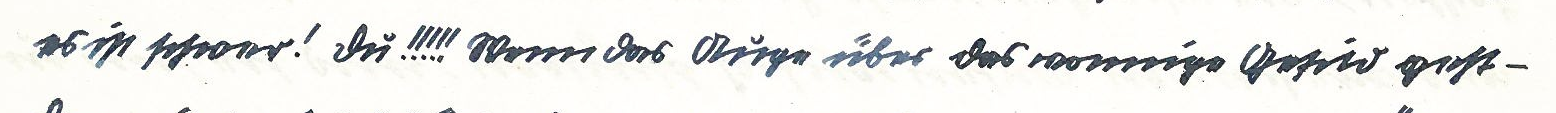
es ist schwer! Du!!!!! Wenn das Auge über das wonnige Gefild geht –
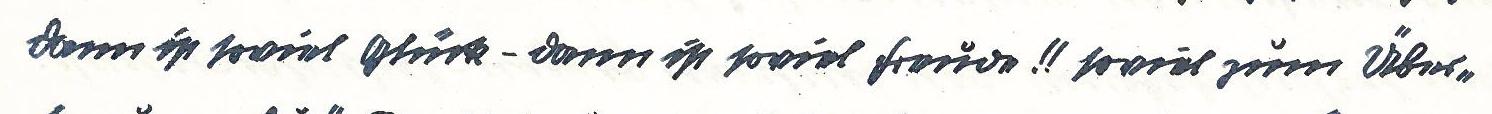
dann ist soviel Glück – dann ist soviel Freude!! soviel zum Über¬
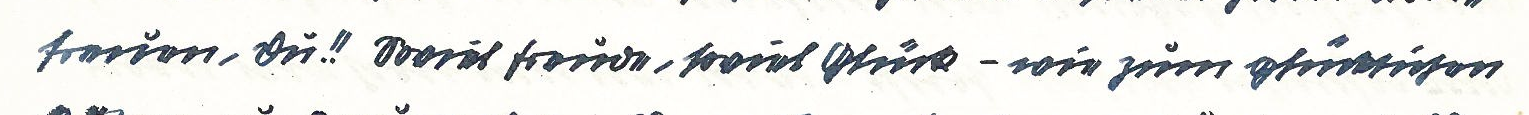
freuen, Du!! Soviel Freude, soviel Glück – wie zum glücklichen
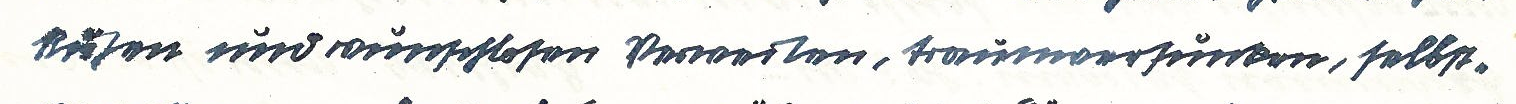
Ruhen und wunschlosen Verweilen, traumversunken, selbst¬
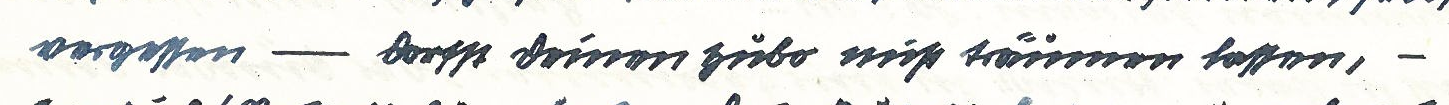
vergessen – darfst Deinen Hubo nicht träumen lassen, –
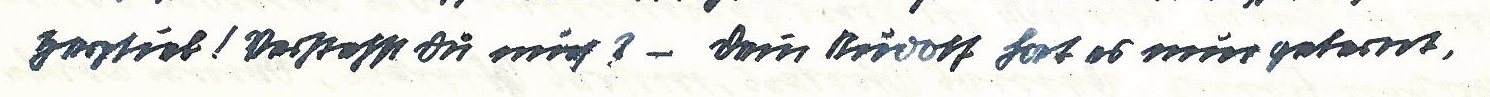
Herzlieb! Verstehst Du mich? – Dein Rudolf hat es nur gelernt,
